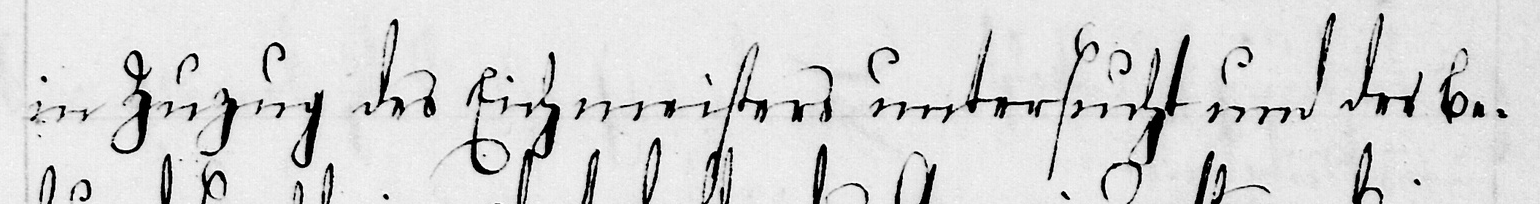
in Zuzug des Eichmeisters untersucht und der Be¬
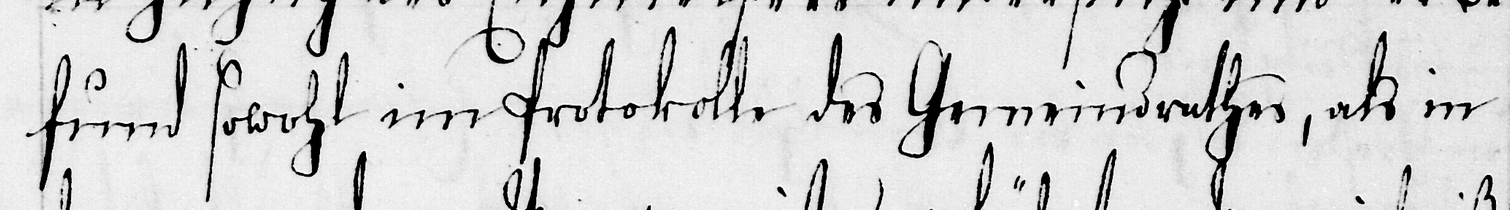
fund sowohl im Protokolle des Gemeindrathes, als in
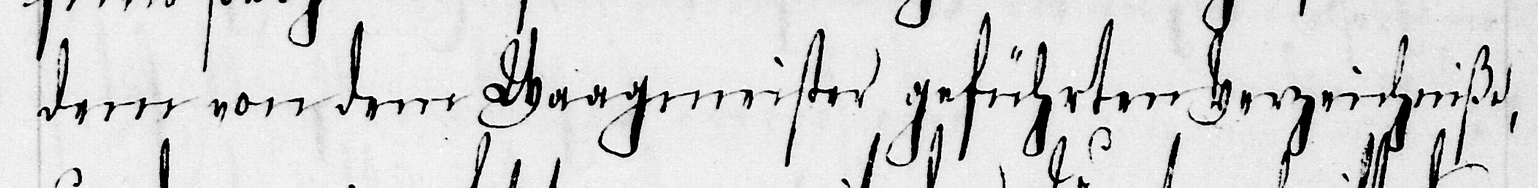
dem von dem Waagmeister geführten Verzeichniße,
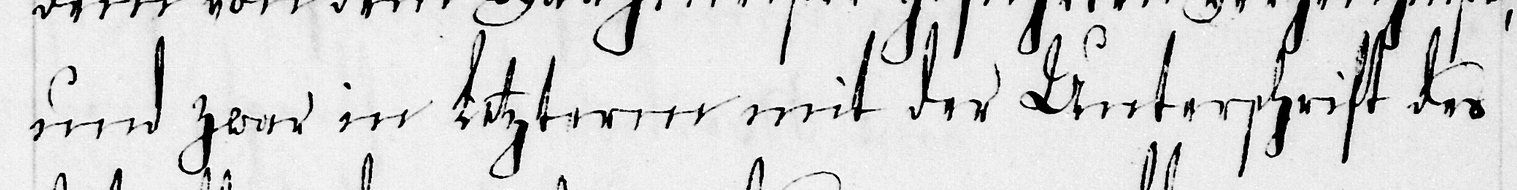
und zwar in Letzterm mit der Unterschrift des
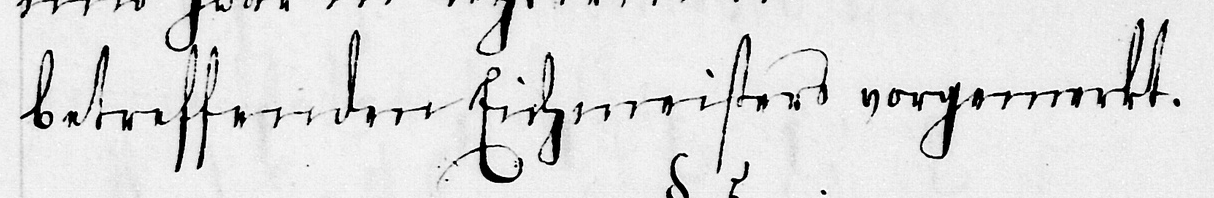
betreffenden Eichmeisters vorgemerkt.
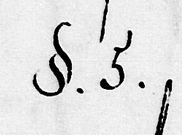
§. 7.
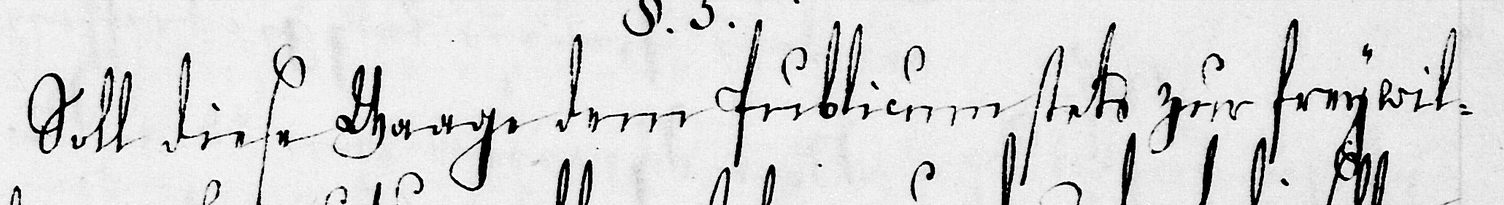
Soll diese Waage dem Publicum stets zur freywil¬
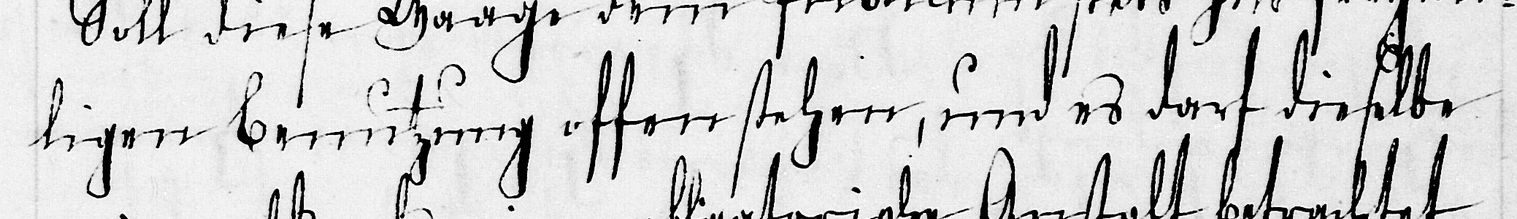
ligen Benutzung offenstehen, und es darf dieselbe
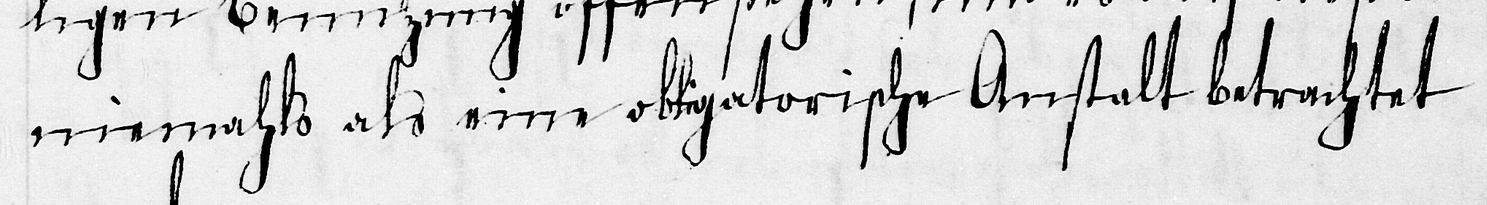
niemahls als eine obligatorische Anstalt betrachtet
